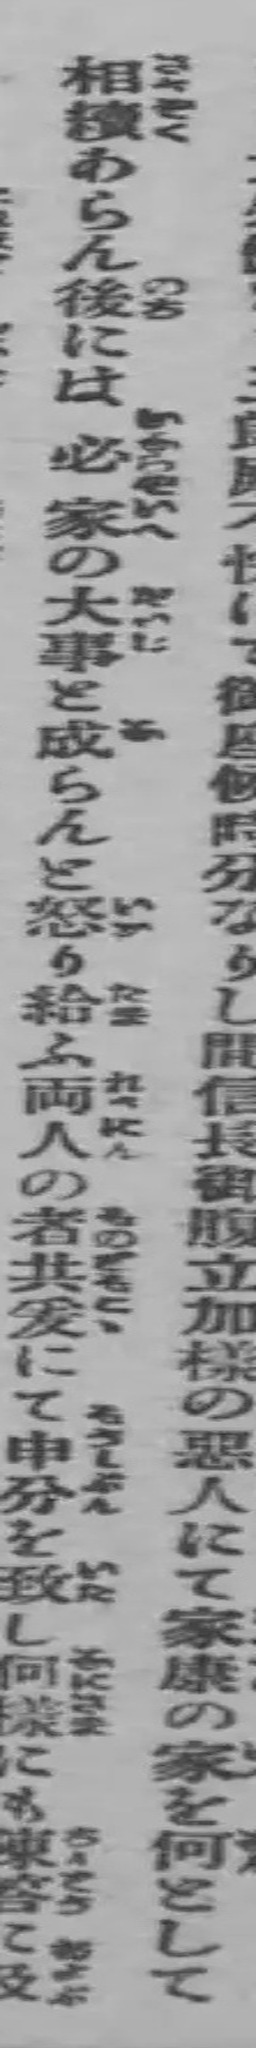相続あらん後には必家の大事と成らんと怒り給ふ両人の者共爰にて申分を致し何様にも陳答に及
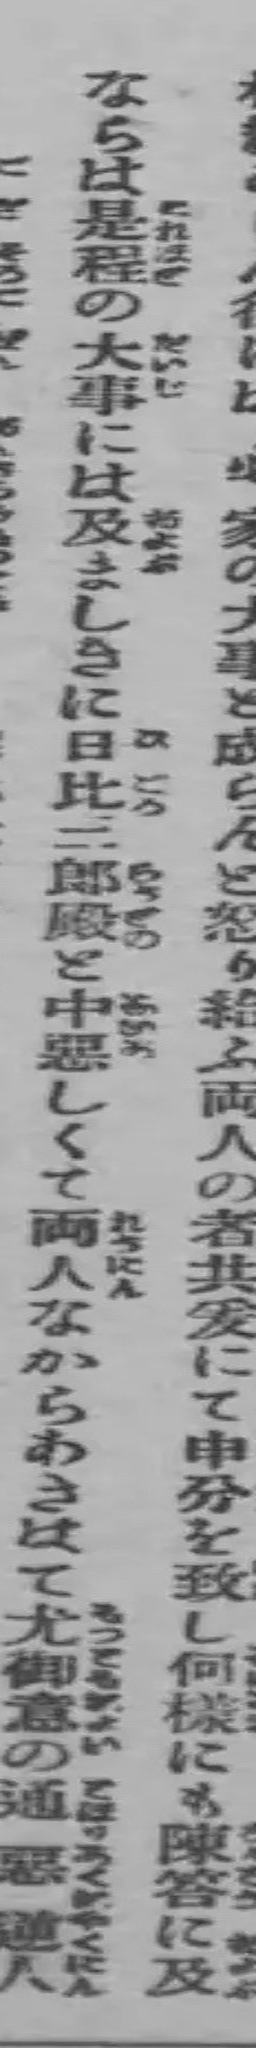ならは是程の大事には及ましきに日比三郎殿と中悪しくて両人なからあきはて尤御意の通悪逆人
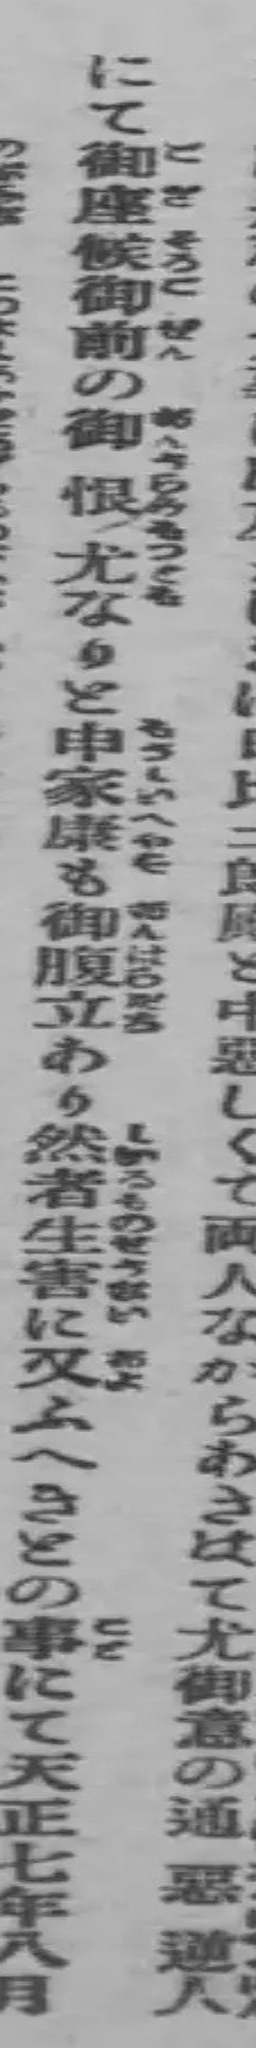にて御座候御前の御恨尤なりと申家康も御腹立あり然者生害に又ふへきとの事にて天正七年八月
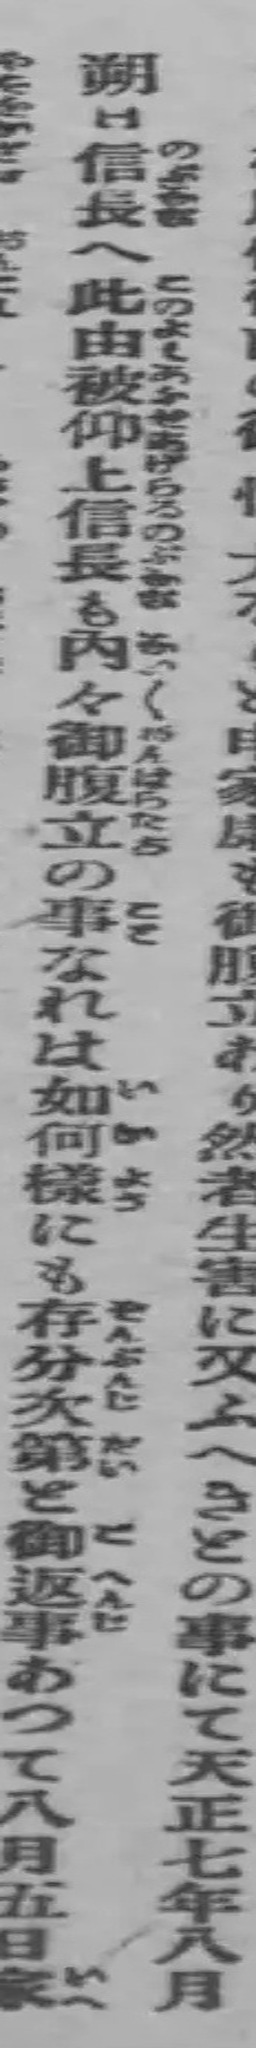朔日信長へ此由被仰上信長も内々御腹立の事なれは如何様にも存分次第と御返事あつて八月五日家
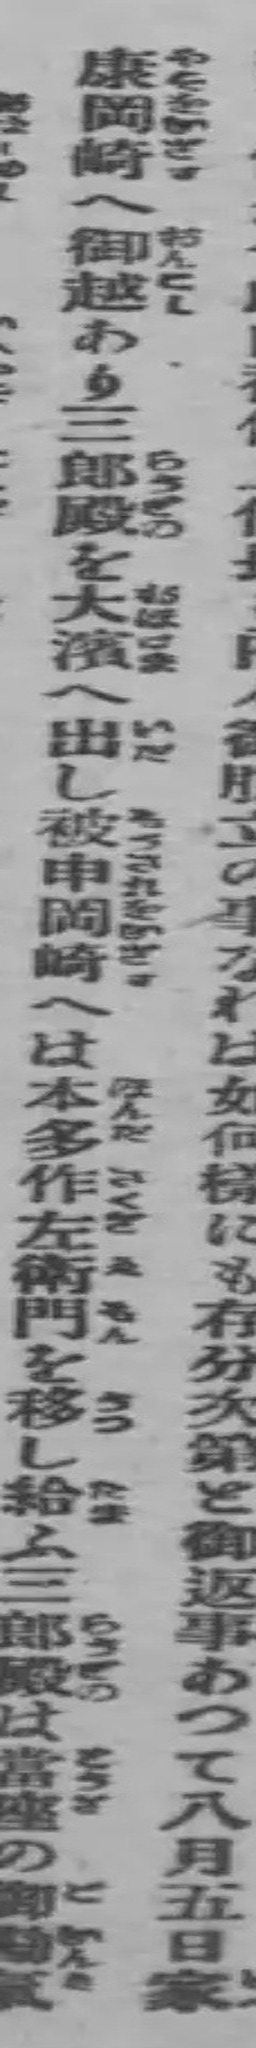康岡崎へ御越あり三郎殿を大浜へ出し被申岡崎へは本多作左衛門を移し給ふ三郎殿は当座の御勘気
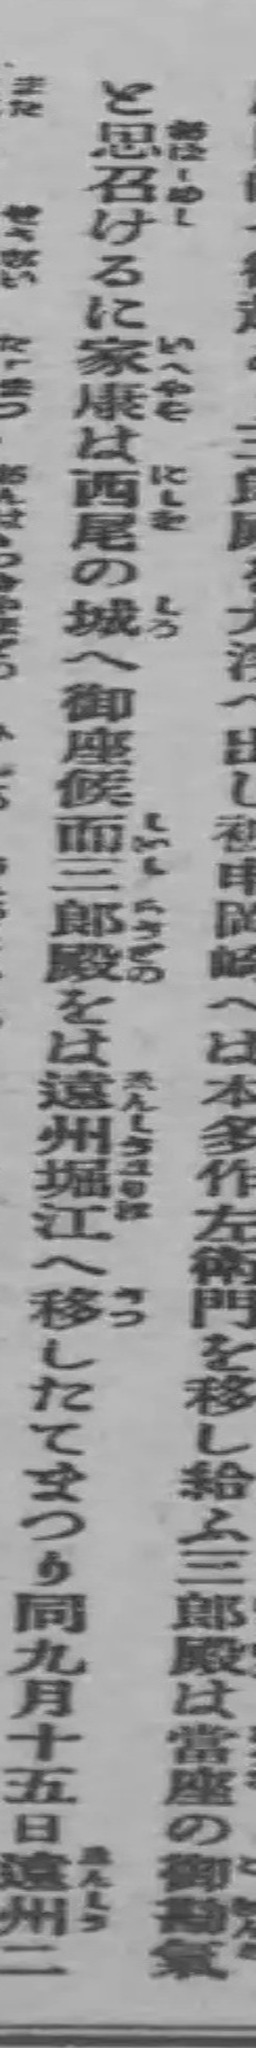と思召けるに家康は西尾の城へ御座候而三郎殿をは遠州堀江へ移したてまつり同九月十五日遠州二
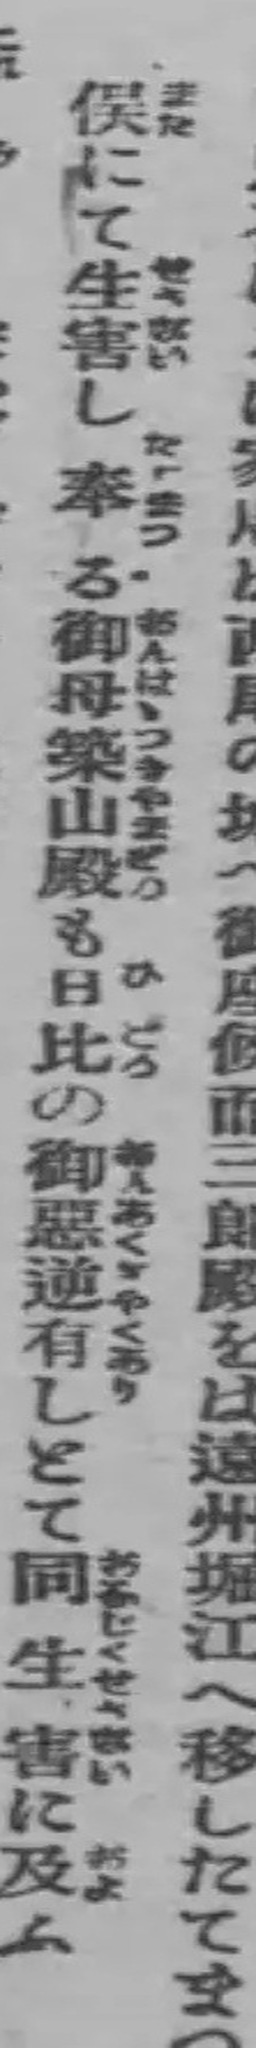俣にて生害し奉る御母築山殿も日比の御悪逆有しとて同生害に及ふ
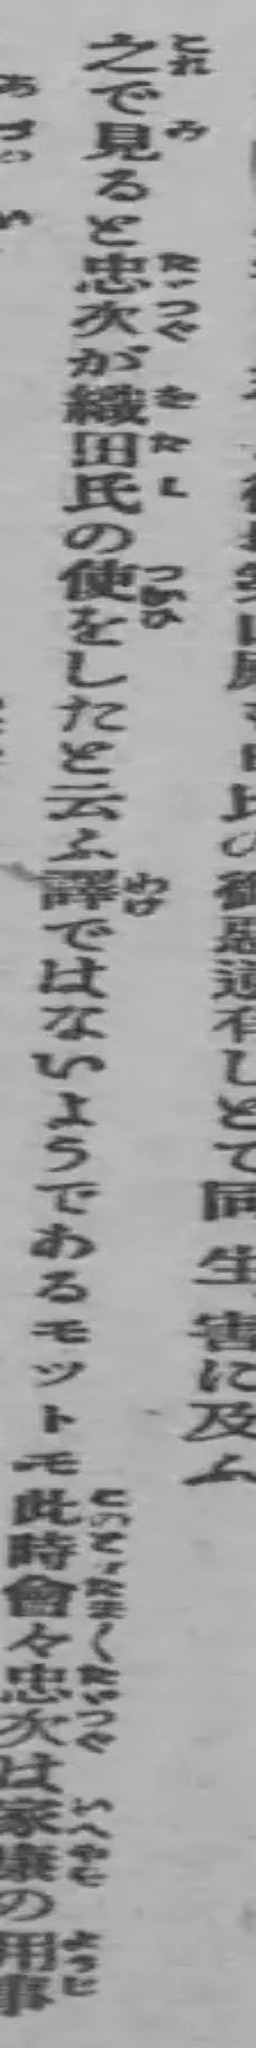之で見ると忠次が織田氏の使をしたと云ふ訳ではないようであるモツトモ此時会々忠次は家康の用事
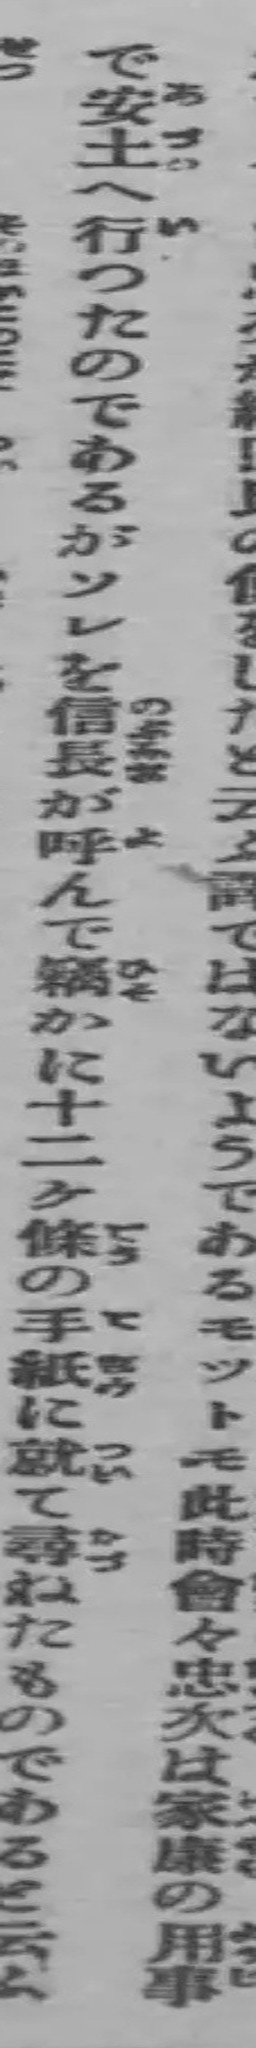で安土へ行つたのであるがソレを信長が呼んで竊かに十二ケ条の手紙に就て尋ねたものであると云ふ
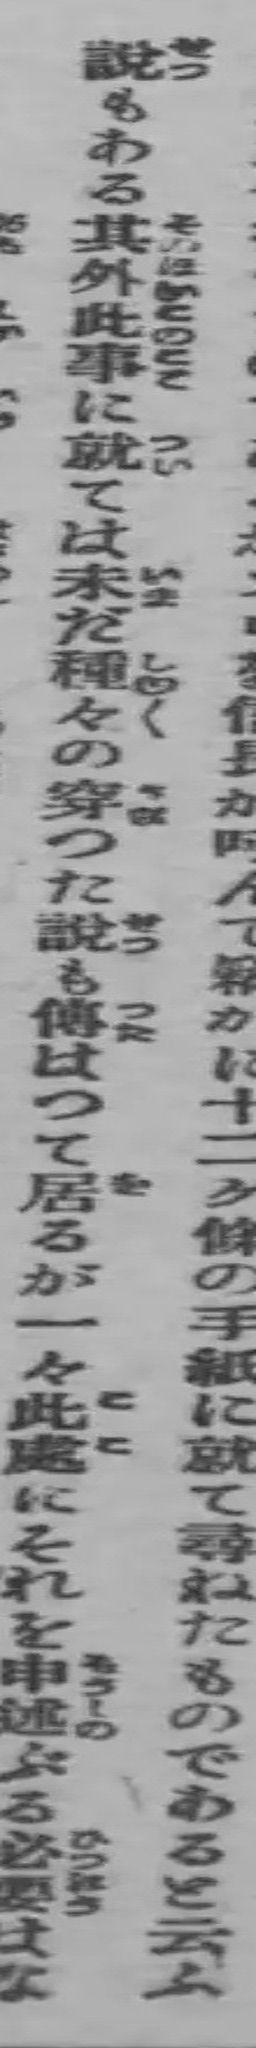説もある其外此事に就ては未だ種々の穿つた説も伝はつて居るが一々此処にそれを申述ぶる必要はな
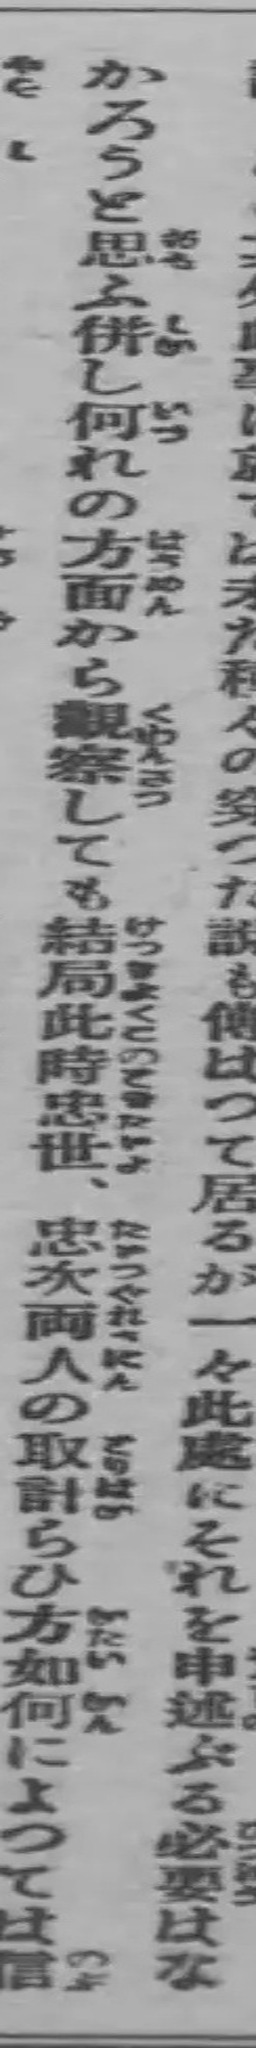かろうと思ふ併し何れの方面から観察しても結局此時忠世、忠次両人の取計らひ方如何によつては信
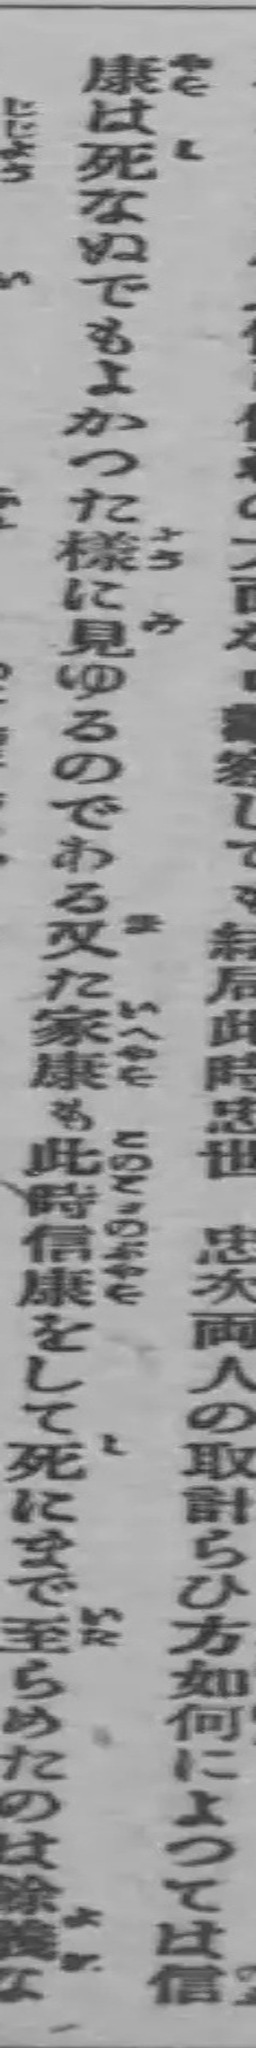康は死なぬでもよかつた様に見ゆるのである又た家康も此時信康をして死にまで至らめたのは余義な
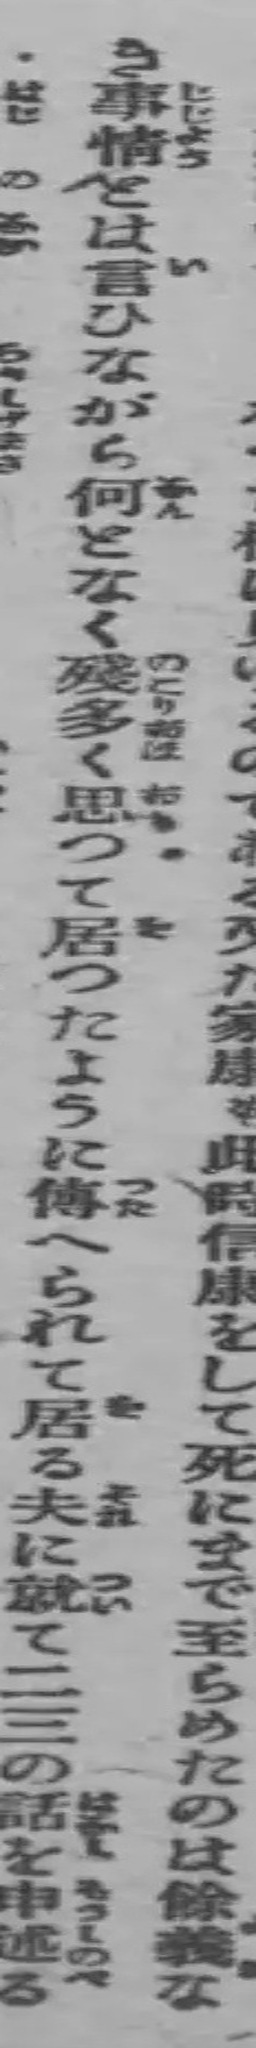き事情とは言ひながら何となく残多く思つて居つたように伝へられて居る夫に就て二三の話を申述る
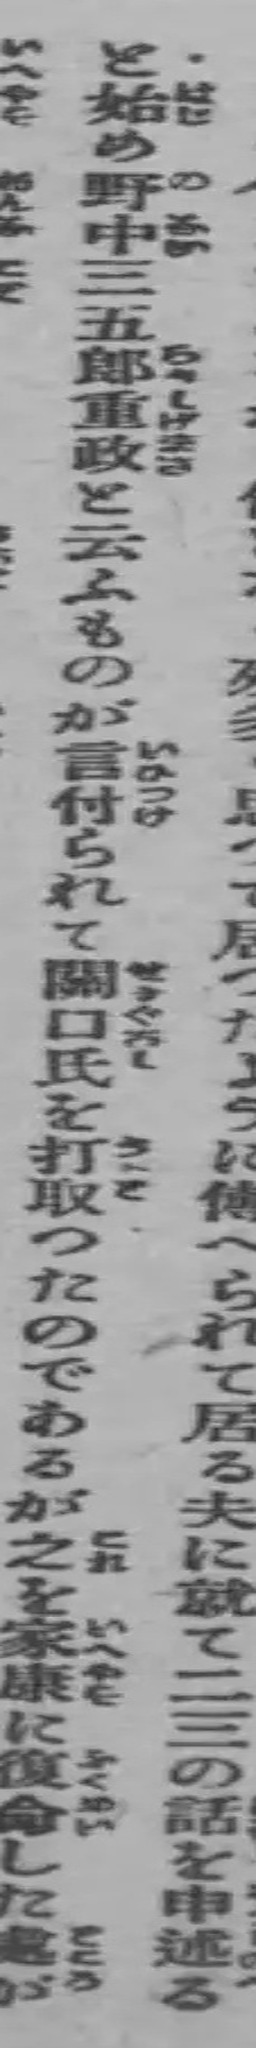と始め野中三五郎重政と云ふものが言付られて関口氏を打取つたのであるが之を家康に復命した処が
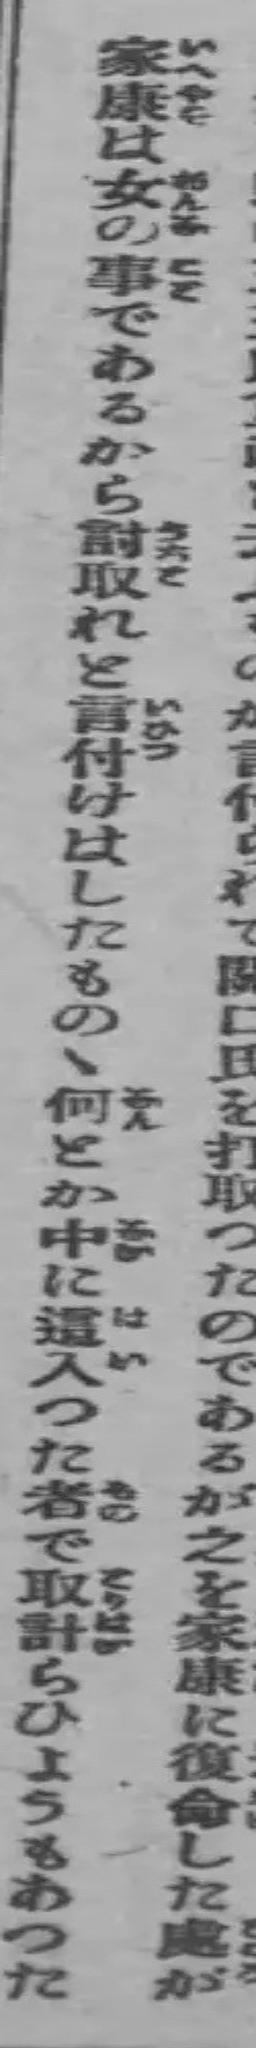家康は女の事であるから討取れと言付けはしたものゝ何とか中に這入つた者で取計らひようもあつた
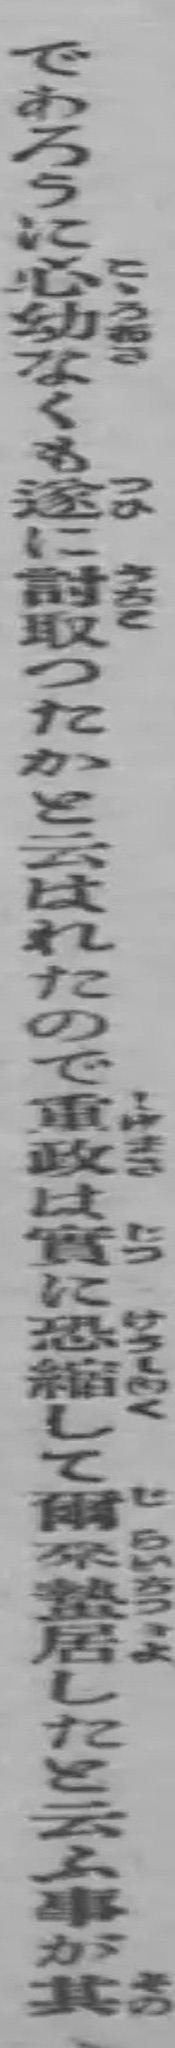であろうに心幼なくも遂に討取つたかと云はれたので重政は実に恐縮して爾来蟄居したと云ふ事が其
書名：豊橋市史談
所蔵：国立国会図書館 National Diet Library, JAPAN
